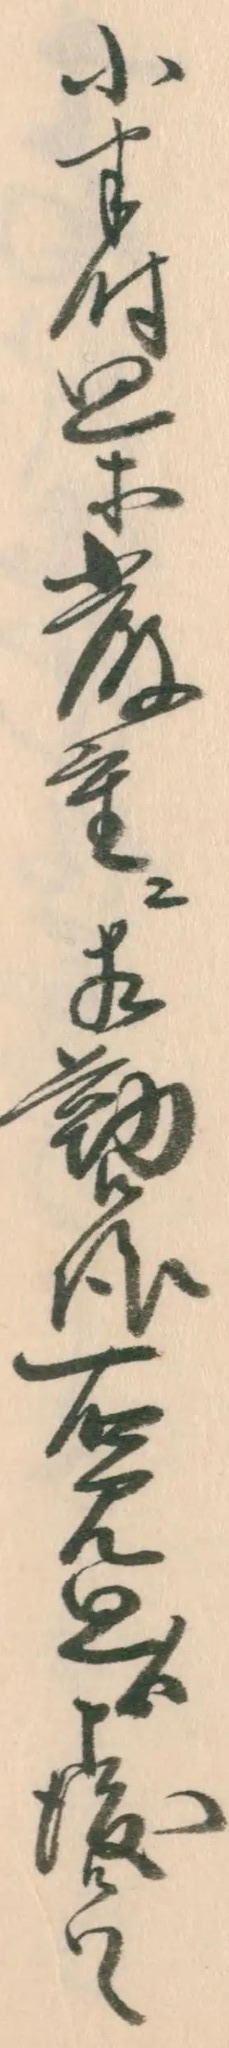小半時廻等厳重ニ相勤候様右見廻ゟ申渡候ハヽ
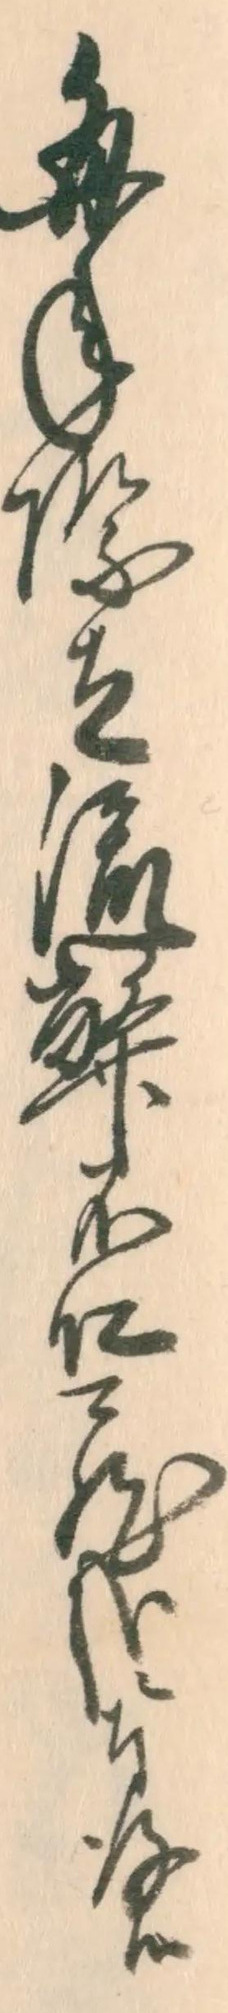毎年際立流弊不仕可然哉ニ奉存候
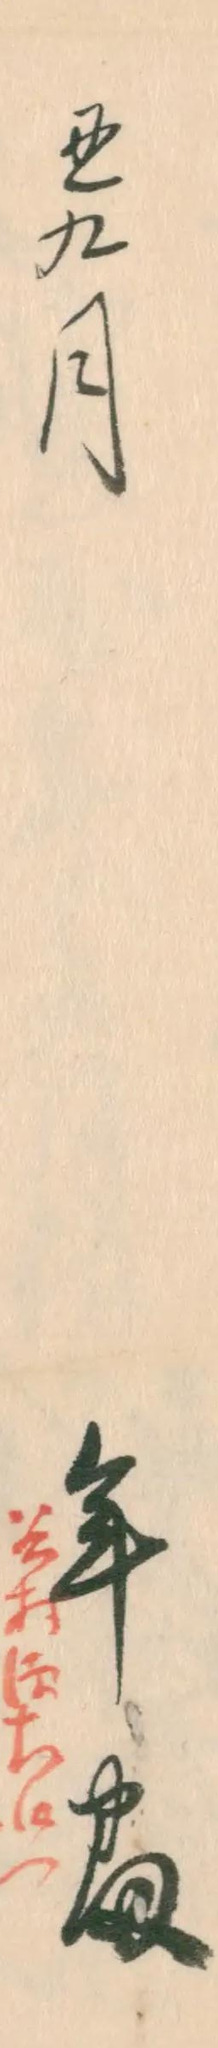丑九月年番
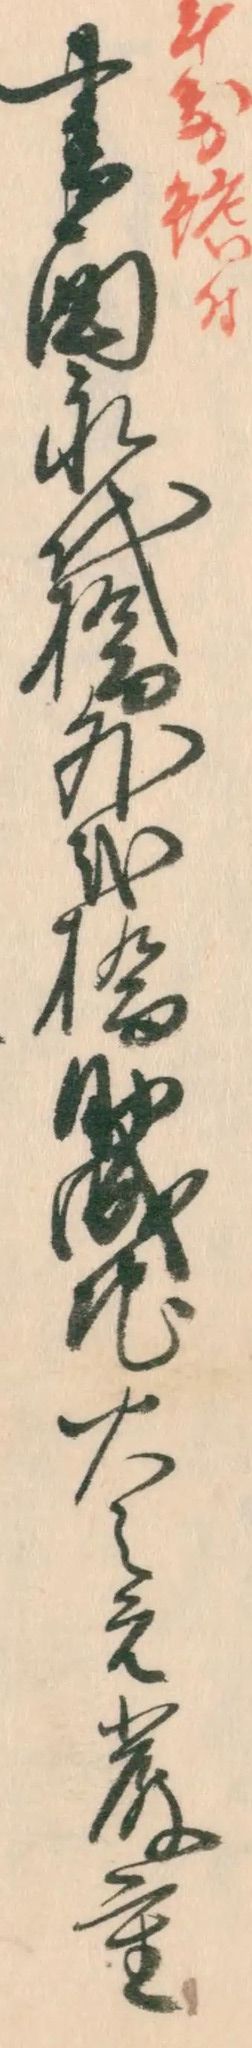書面永代橋外弐橋助成地火之元厳重
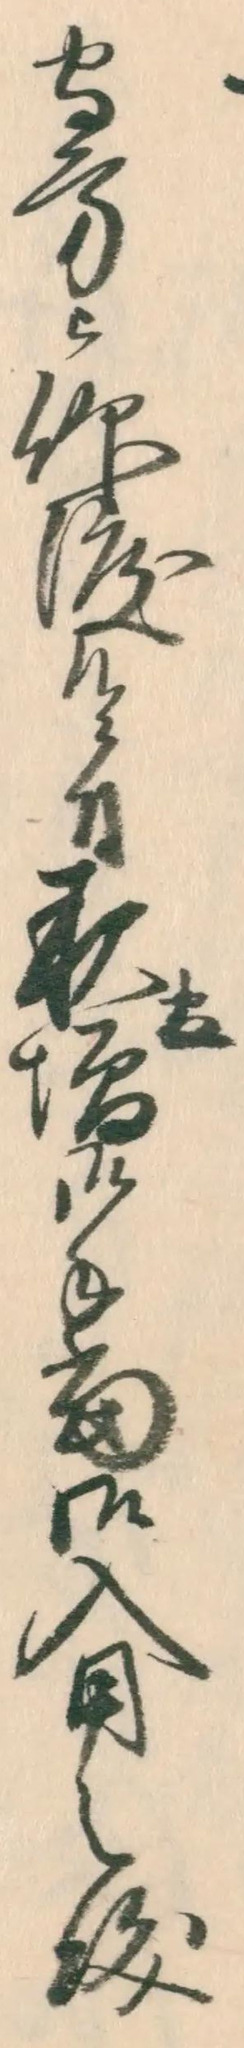守方被仰渡候ニ付夜番増御手当御入用之儀
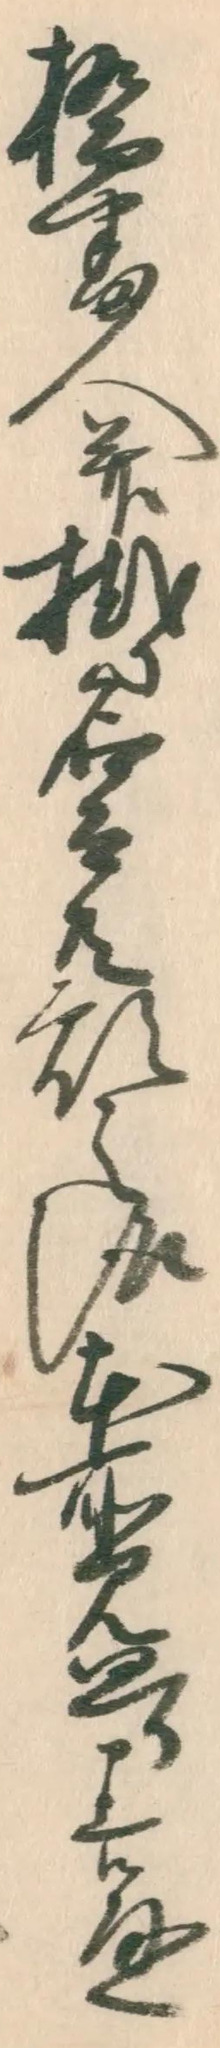橋番人并掛り名主共願之趣本所見廻り申上候通
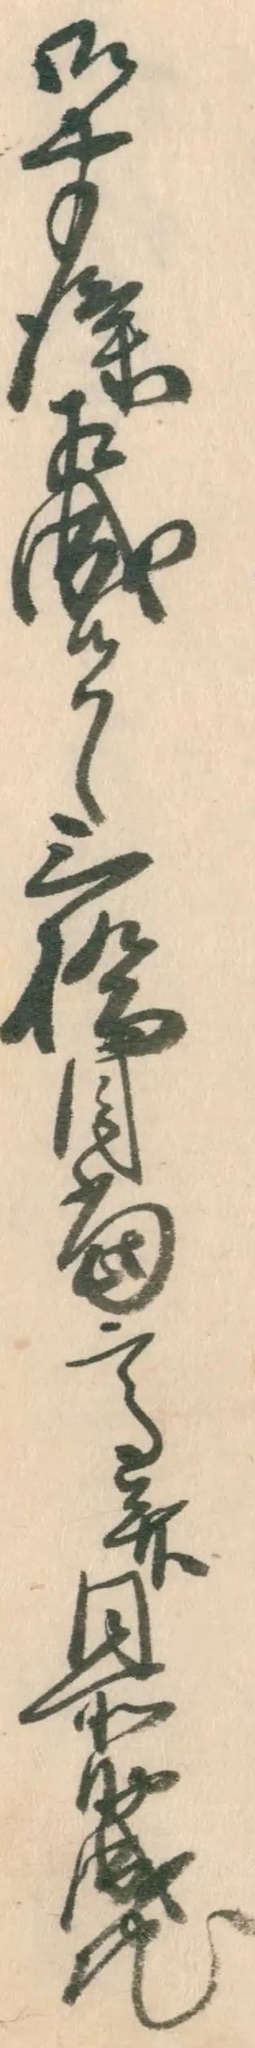御聞済相成候ハヽ三橋目当高并同所助成地

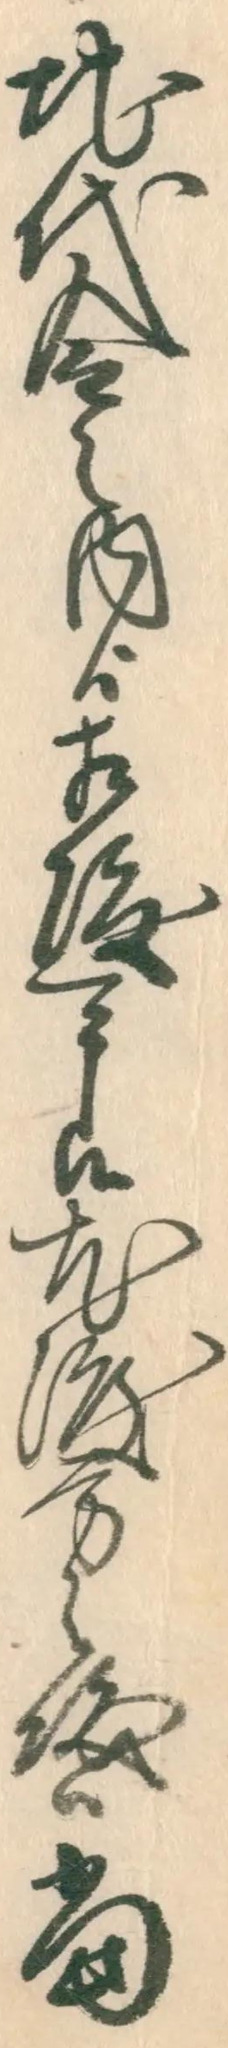地代金之内ゟ相渡可申候尤渡方之儀ハ当
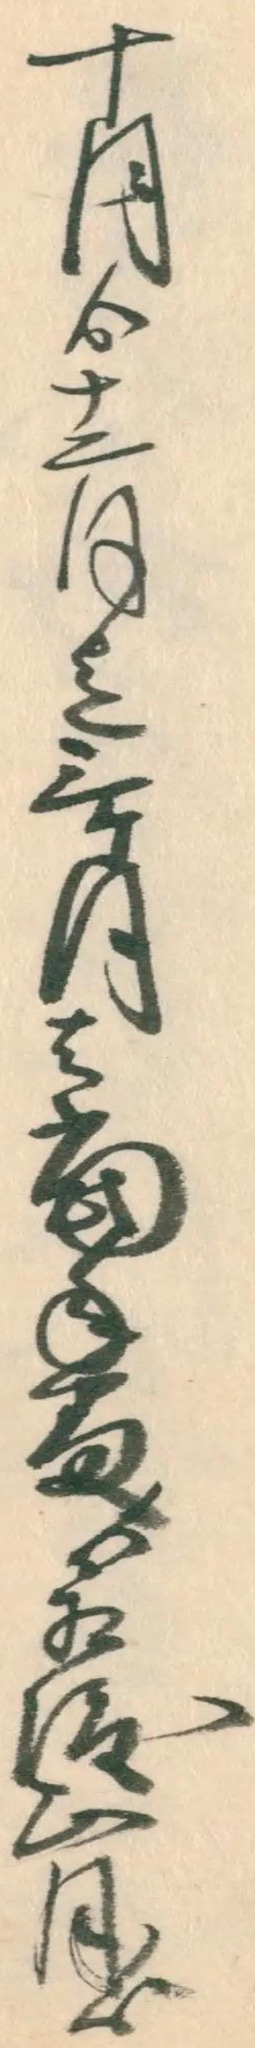十月ゟ十二月迄三ケ月は当年番ゟ相渡正月ゟ
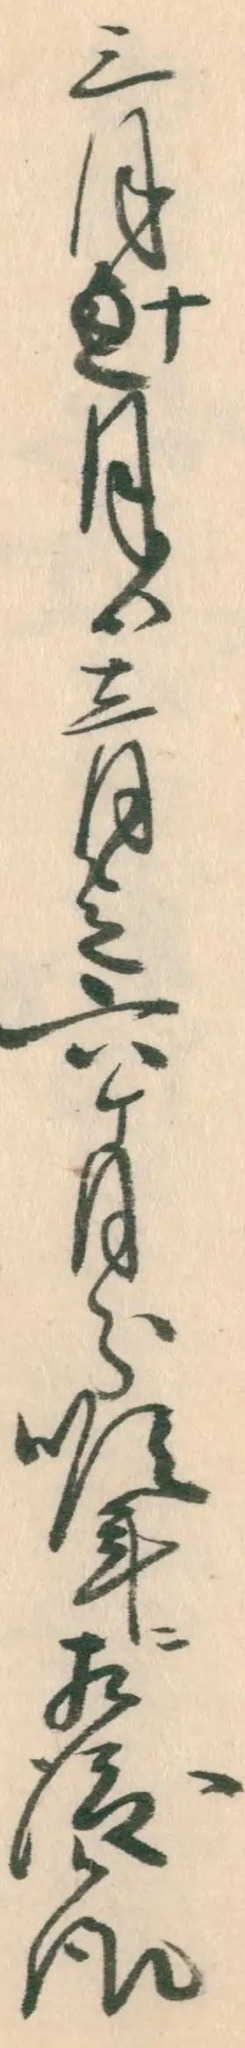三月十月ゟ十二月迄六ケ月分明年ニ相渡候様
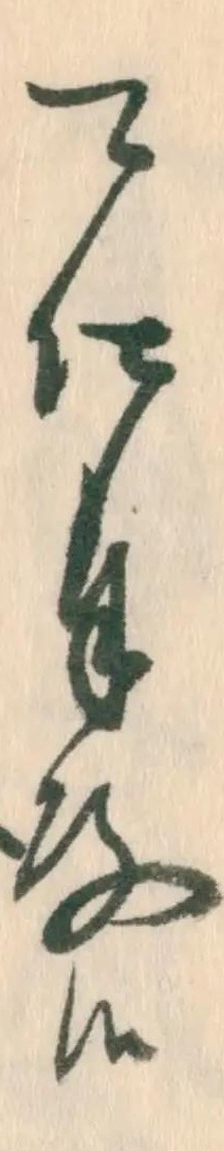可仕奉存候
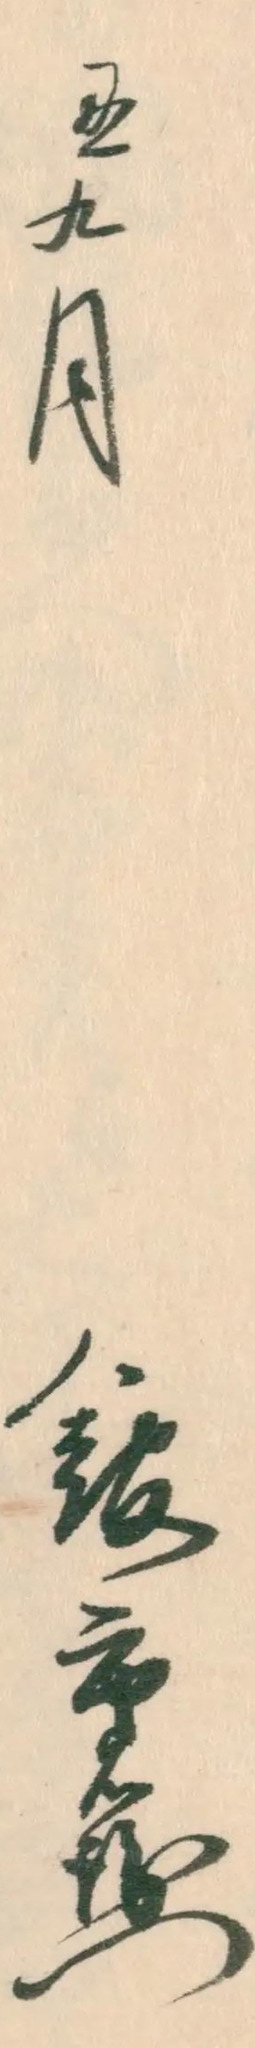丑九月館市右衛門
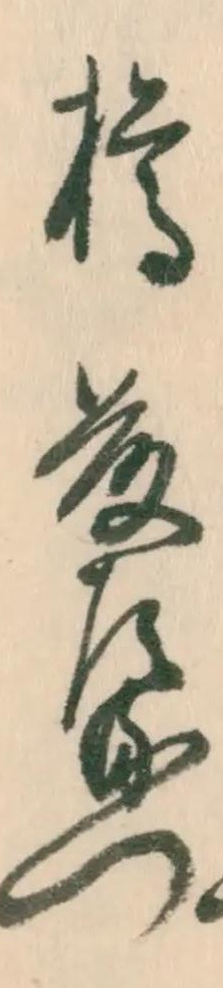樽藤左衛門
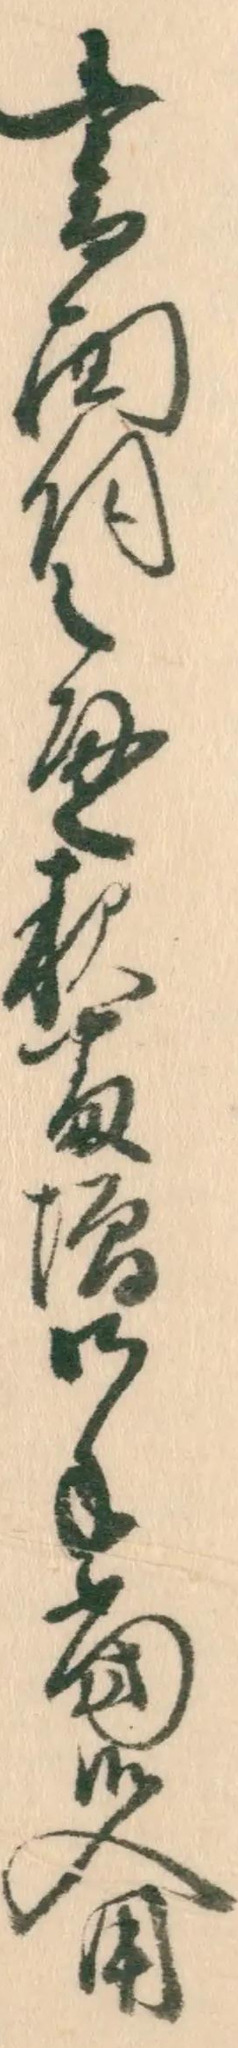書面伺之通夜番増御手当御入用
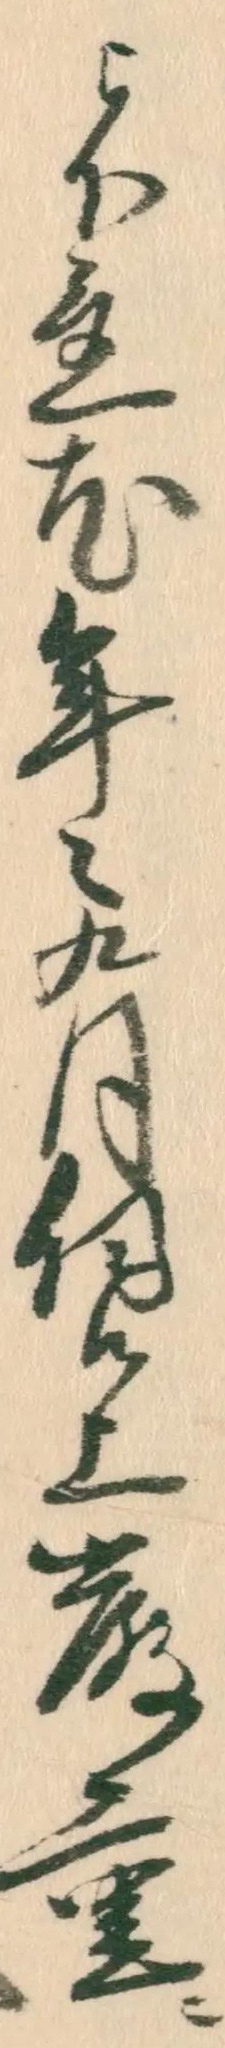被下置尤年々九月伺候上厳重ニ
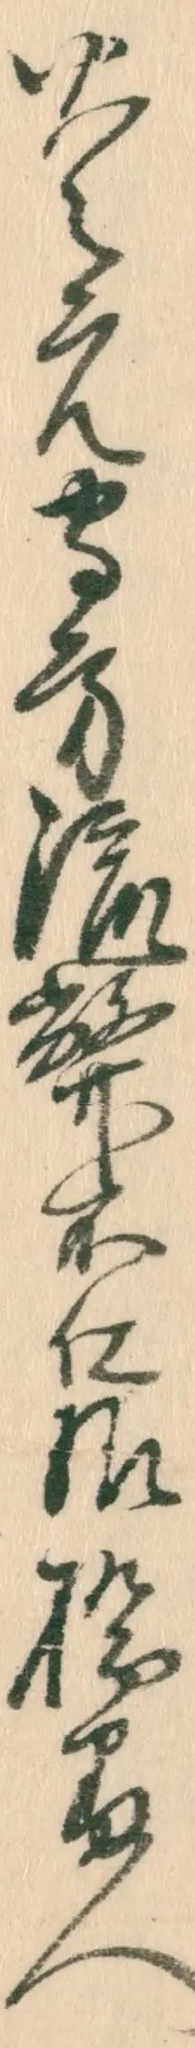火之元守方流弊不仕様橋番人
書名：三橋 17巻. [7] 三橋小破御修復書留　但御奉行御掛リ替地震潰橋番屋　嘉永四亥年より安政二卯年迄　上
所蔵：国立国会図書館 National Diet Library, JAPAN
